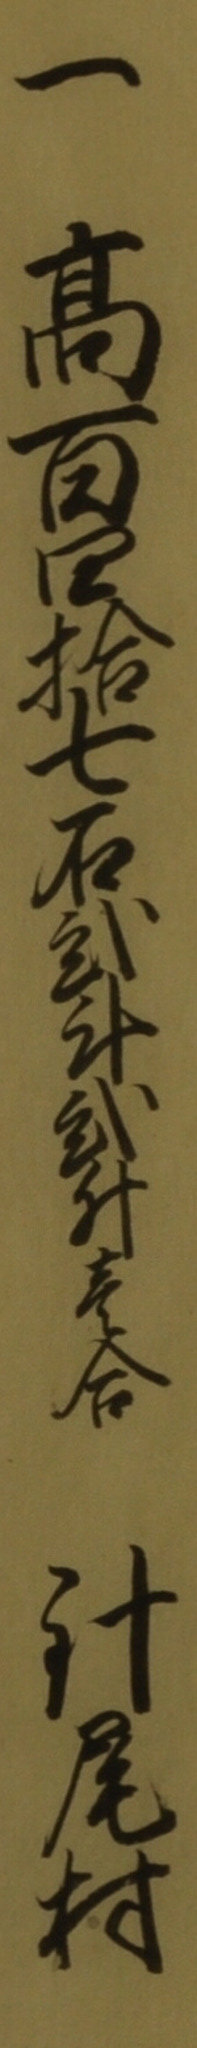一高百四拾七石弐斗弐升壱合針尾村
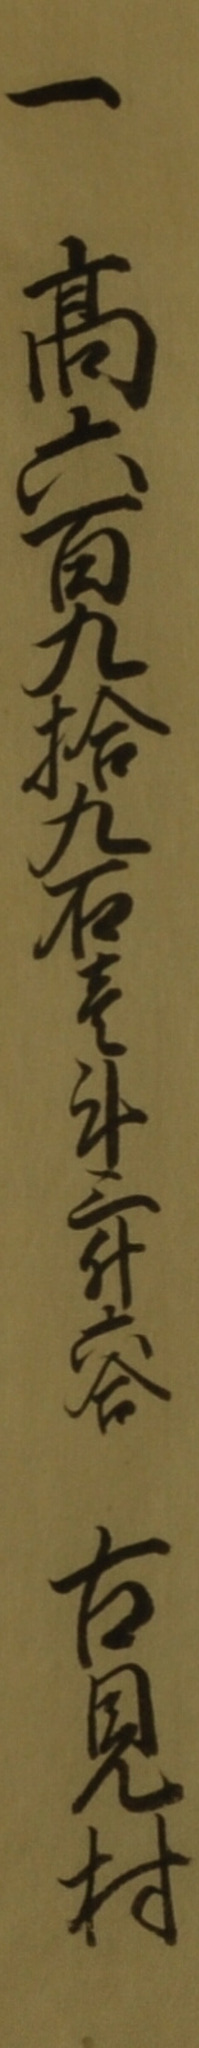一高六百九拾九石壱斗三升六合古見村
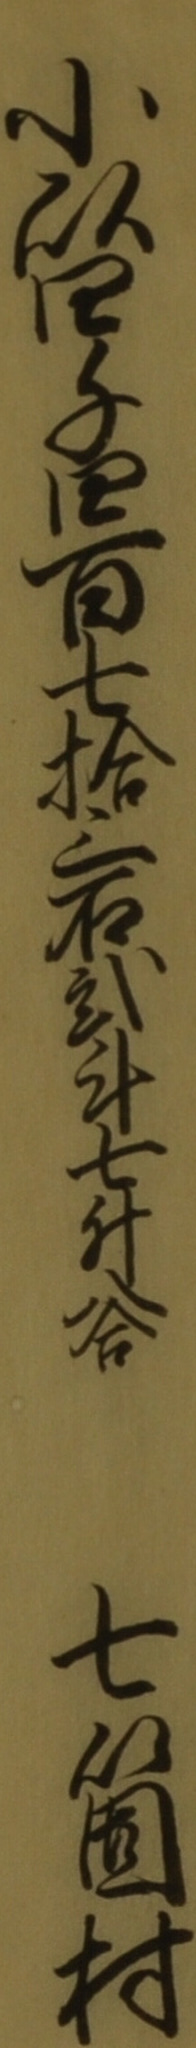小以四千四百七拾三石弐斗七升八合七箇村
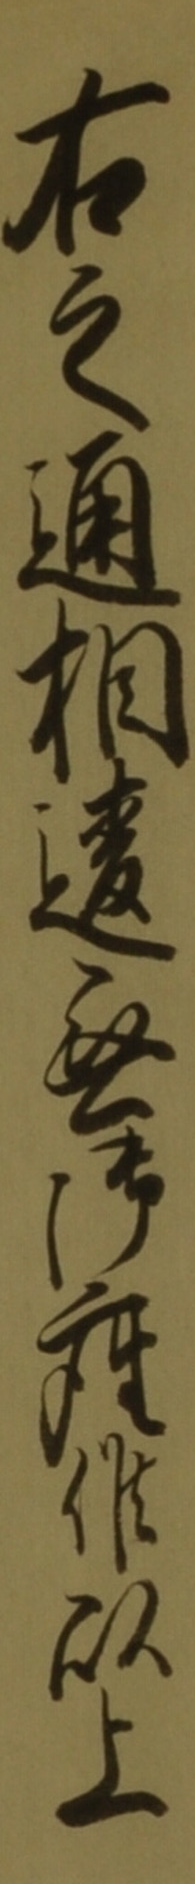右之通相違無御座候以上
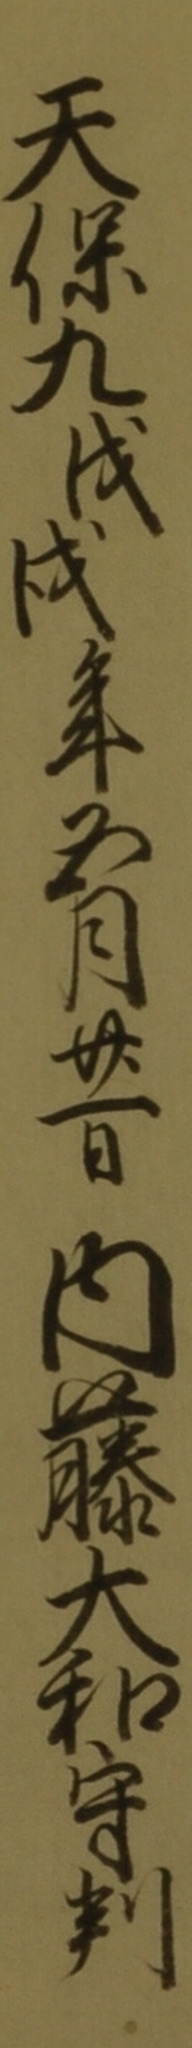天保九戊戌年五月廿一日内藤大和守判
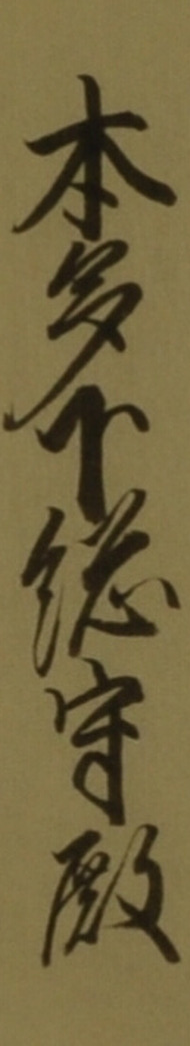本多下総守殿
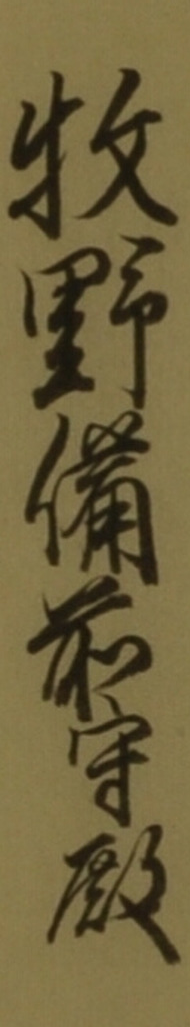牧野備前守殿

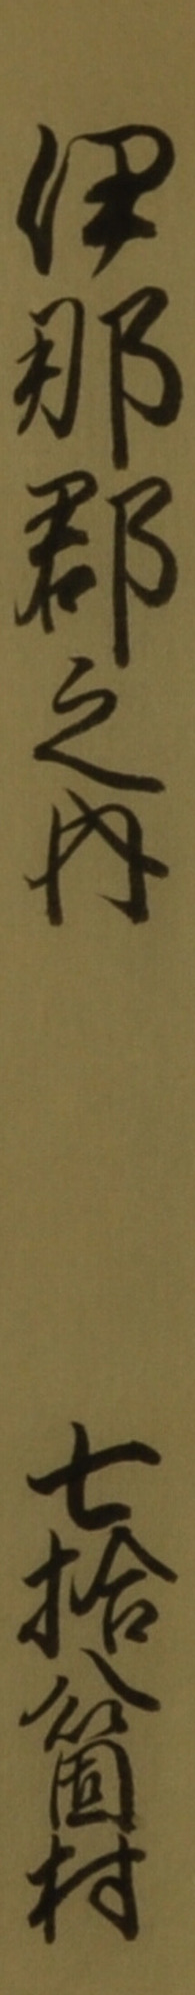伊那郡之内七拾八箇村
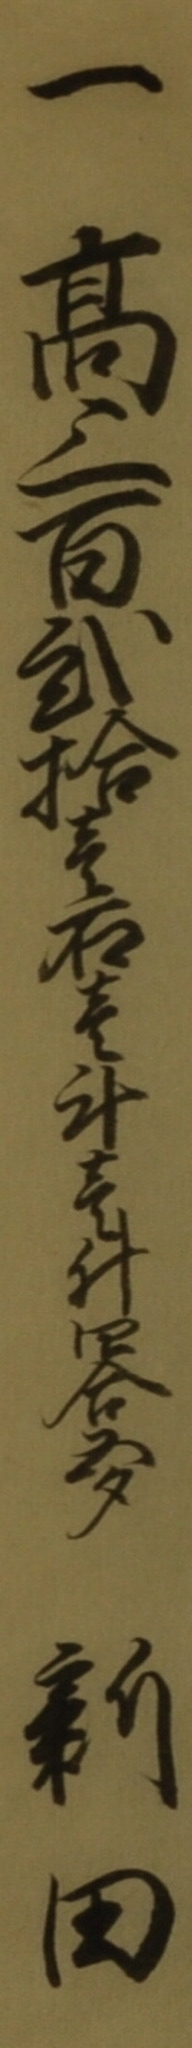一高三百弐拾壱石壱斗壱升四合五勺新田
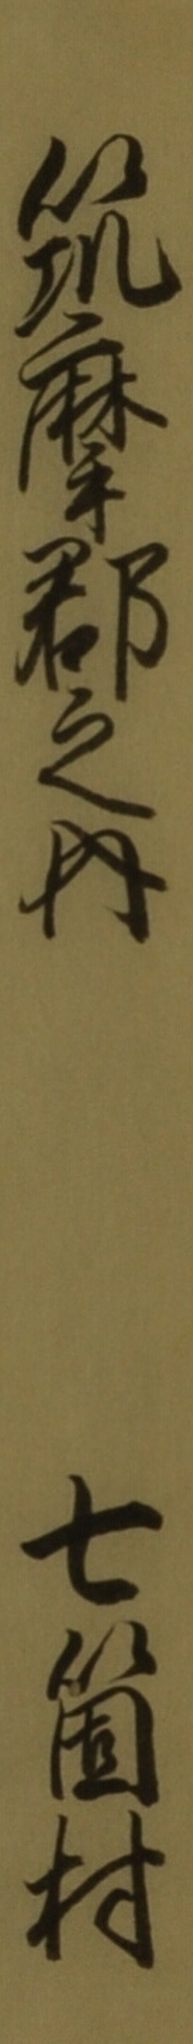筑摩郡之内七箇村
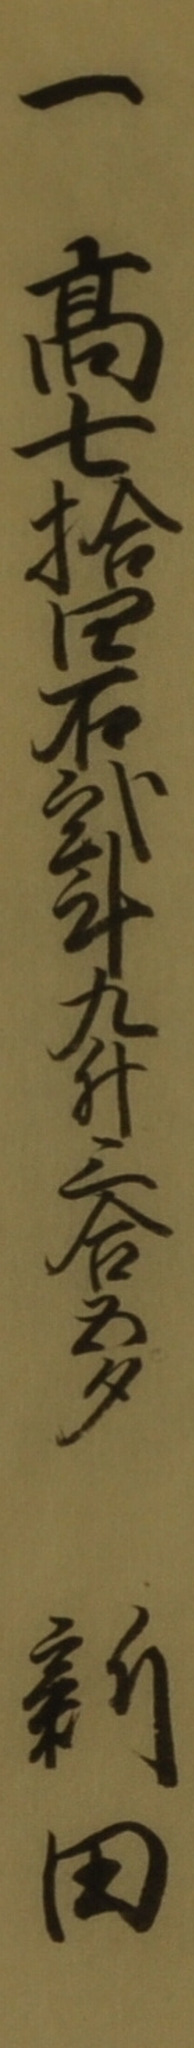一高七拾四石弐斗九升三合五勺新田
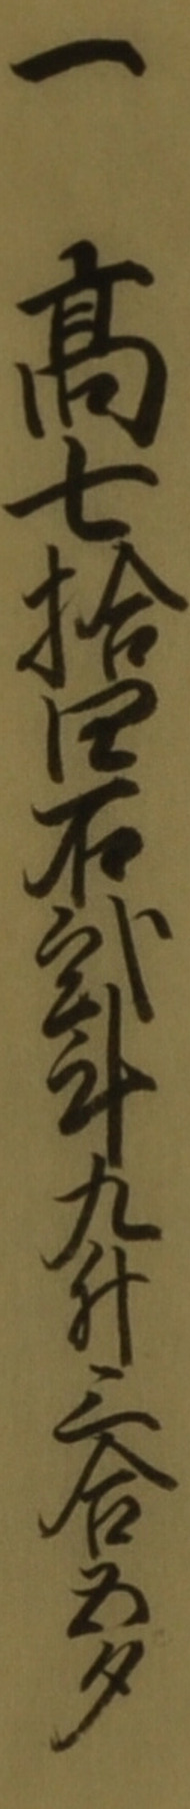一高七拾四石弐斗九升三合五勺新田
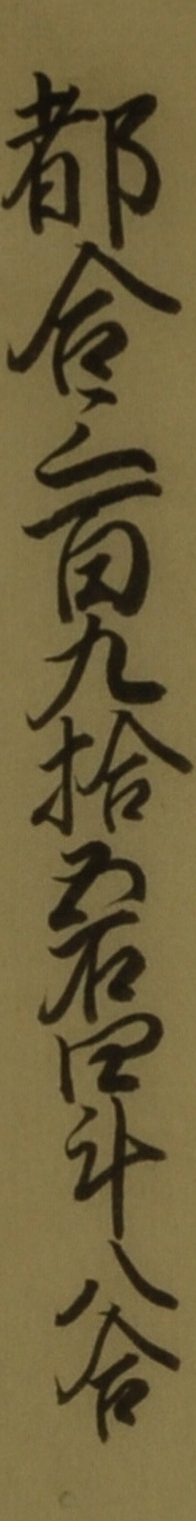都合三百九拾五石四斗八合
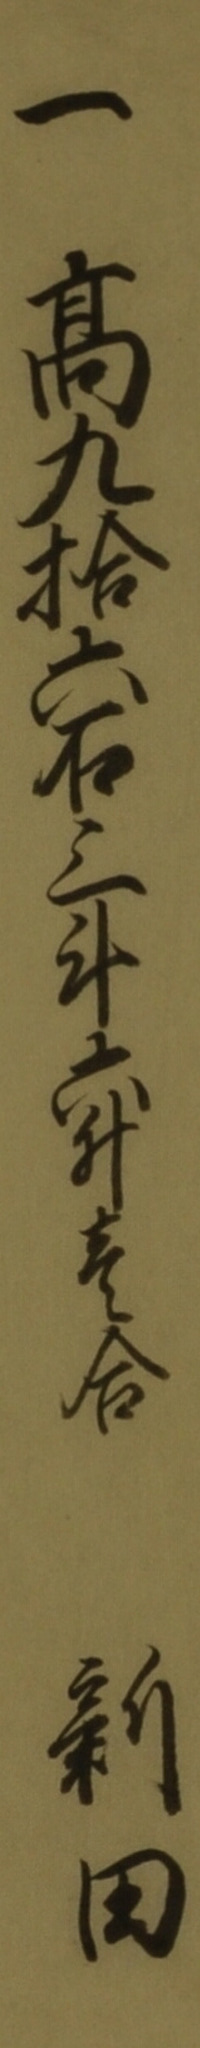一高九拾六石三斗六升壱合新田
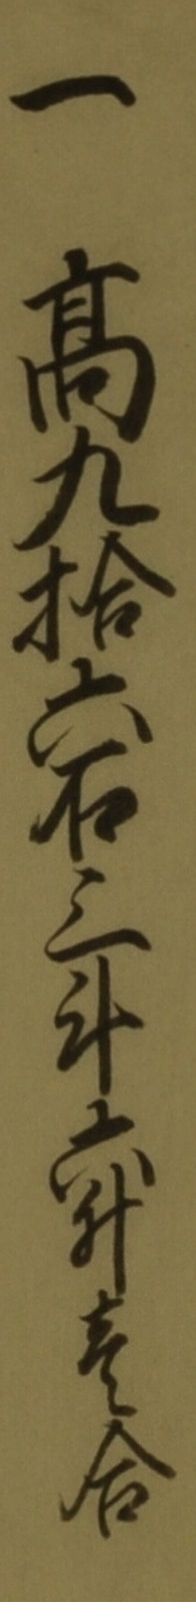一高九拾六石三斗六升壱合新田
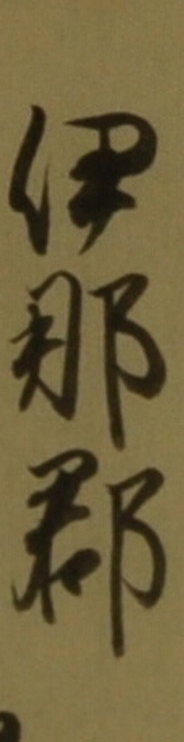伊那郡
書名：信濃国伊那郡筑摩郡高遠領知郷村高辻帳
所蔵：伊那市立高遠町図書館・合同会社AMANE
